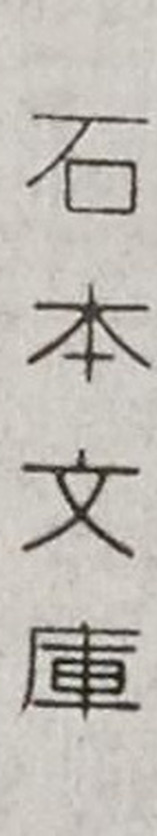石本文庫-

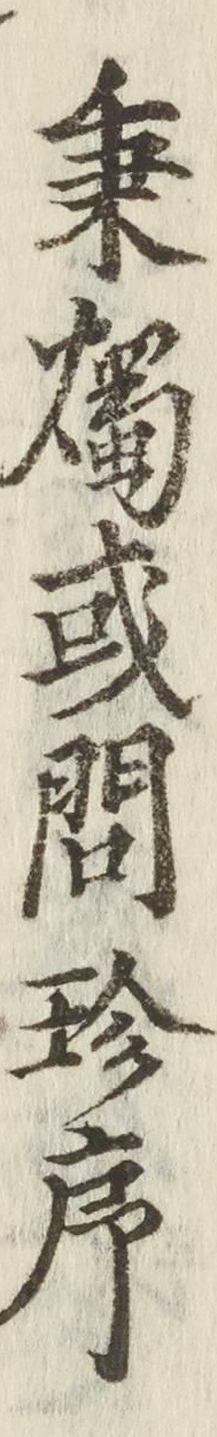秉燭或問珍序

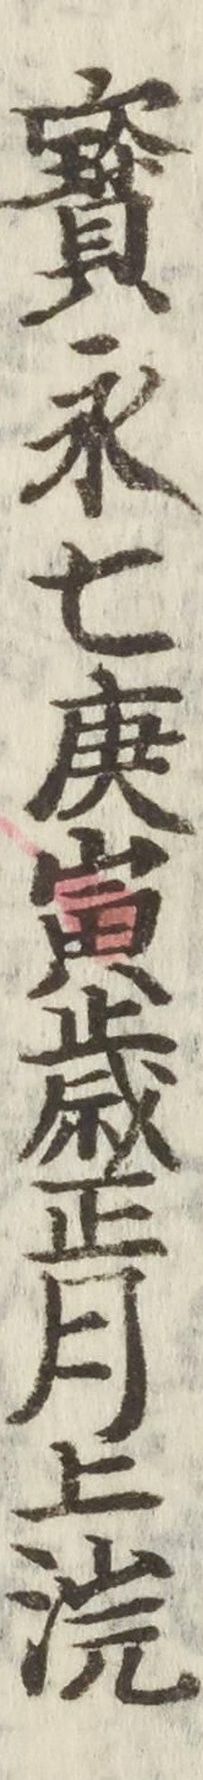宝永七庚寅歳正月上浣
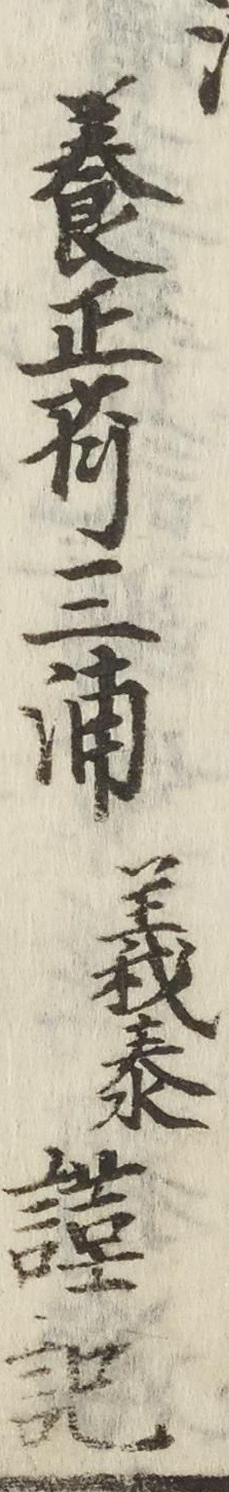養正斎三浦義泰謹記

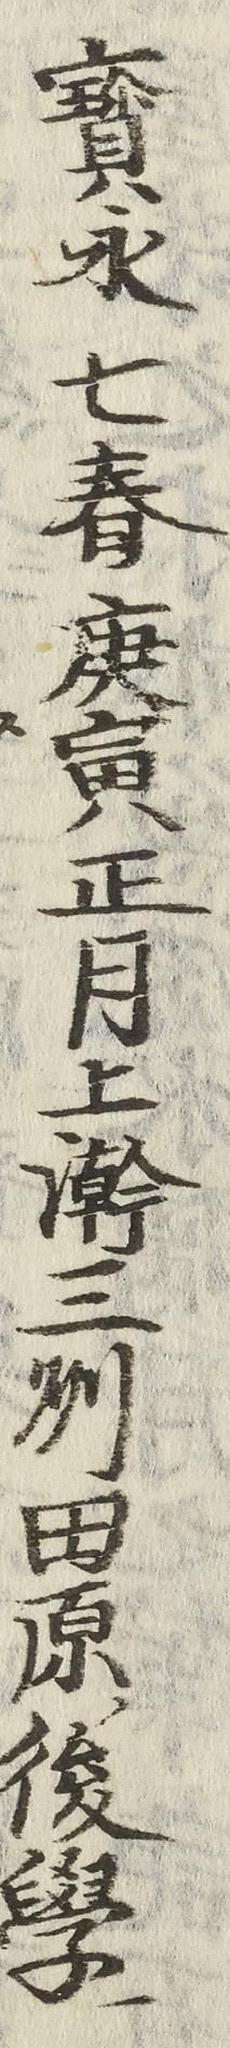宝永七春庚寅正月上澣三州田原後学
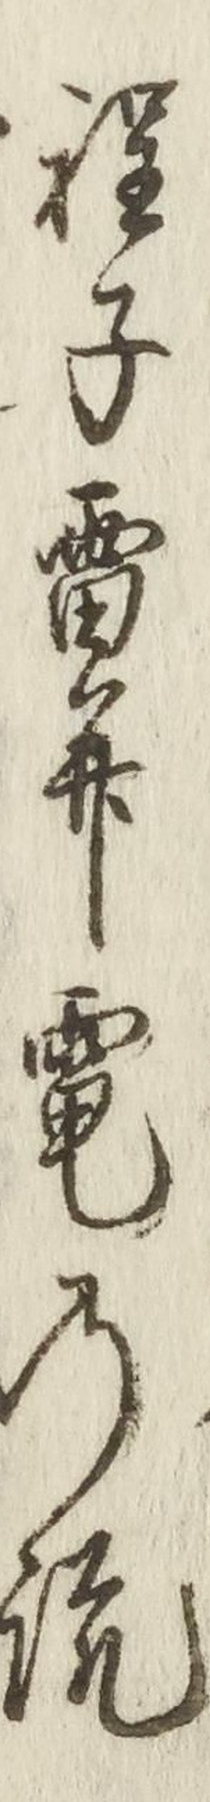程子雷幷電の説
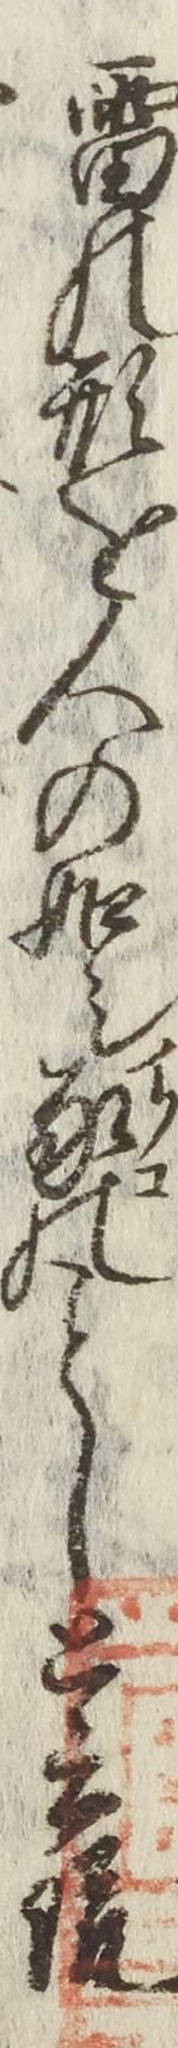雷の形を人の如し豕のことしと云説
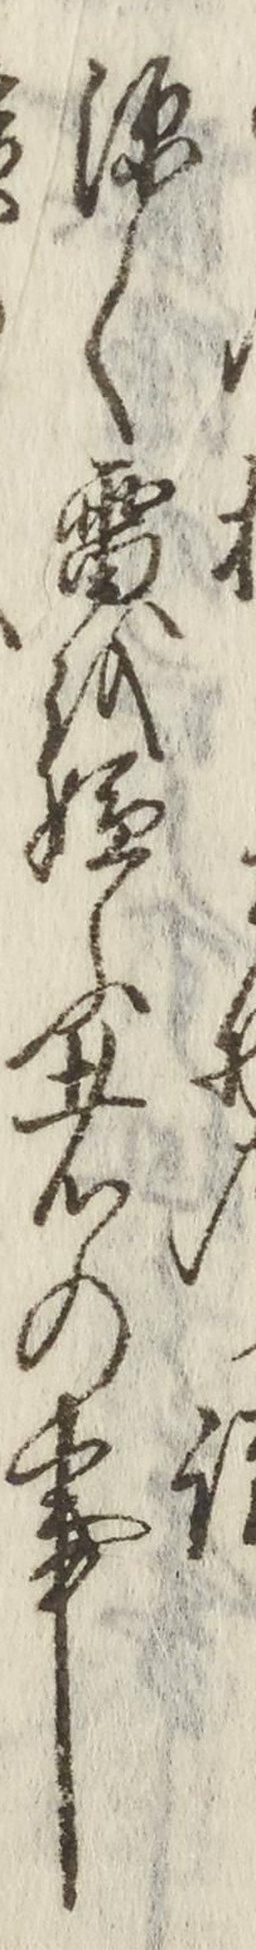深く雷を嫌ふ者の事
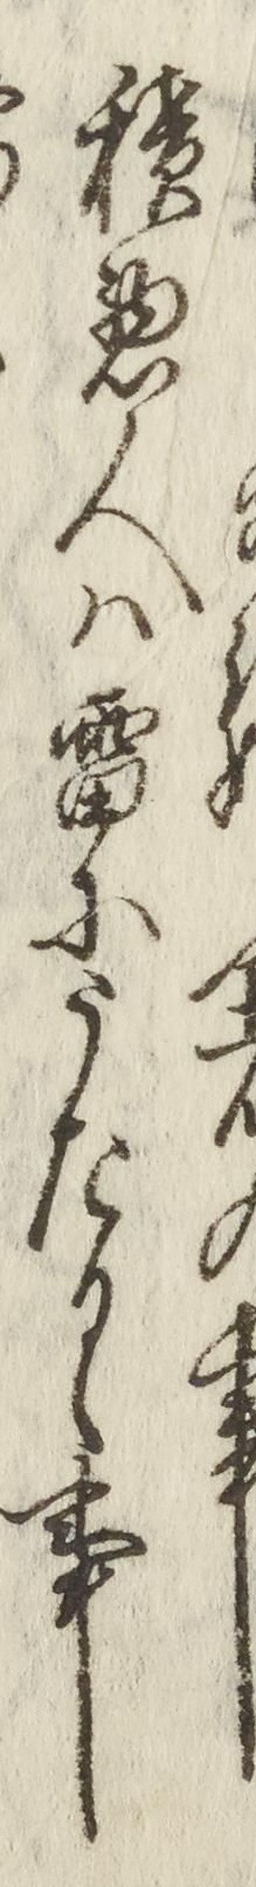積悪人は雷にうたるゝ事
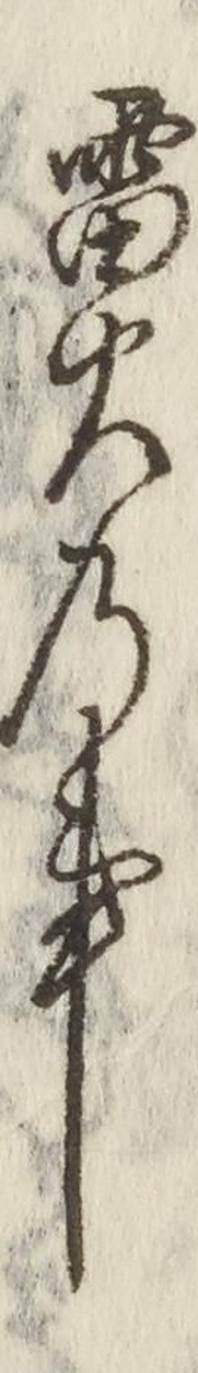雷火の事
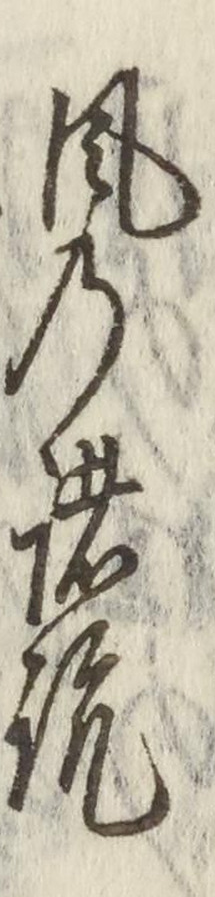風の諸説
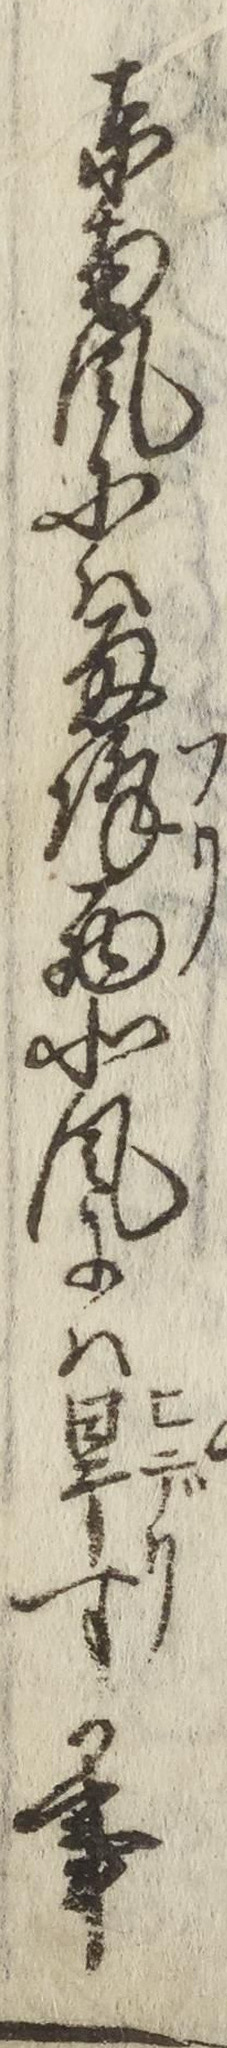東南風には雨降西風には旱する事

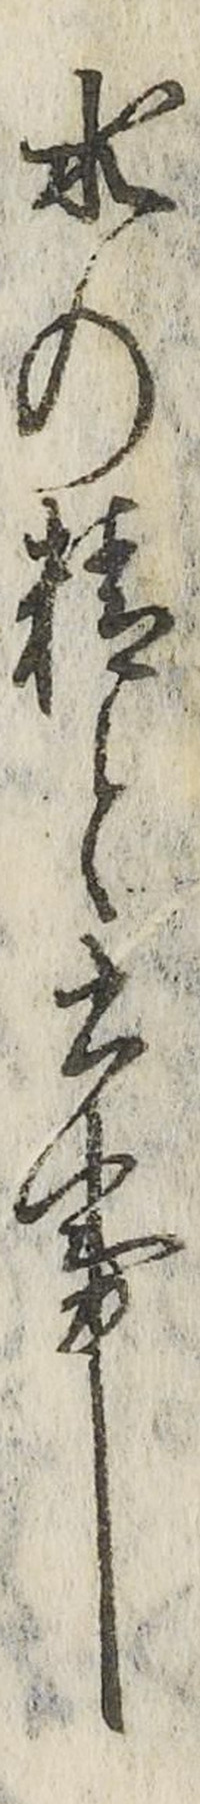水の精と云事
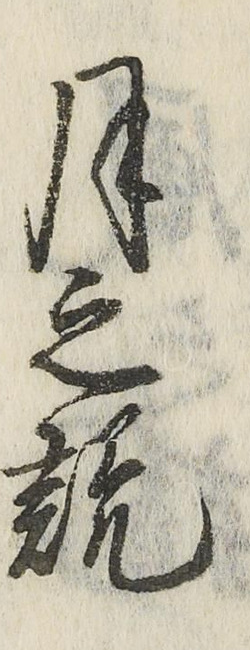雷之説
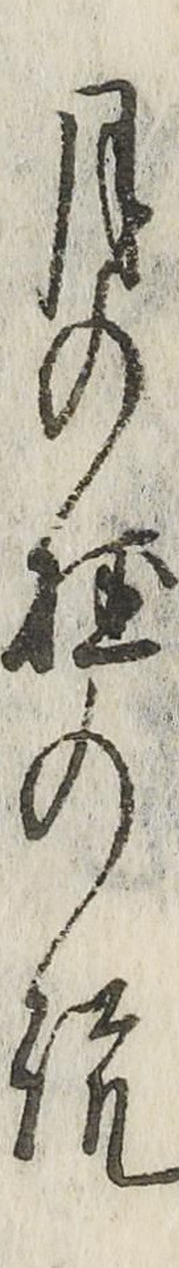月の桂の説
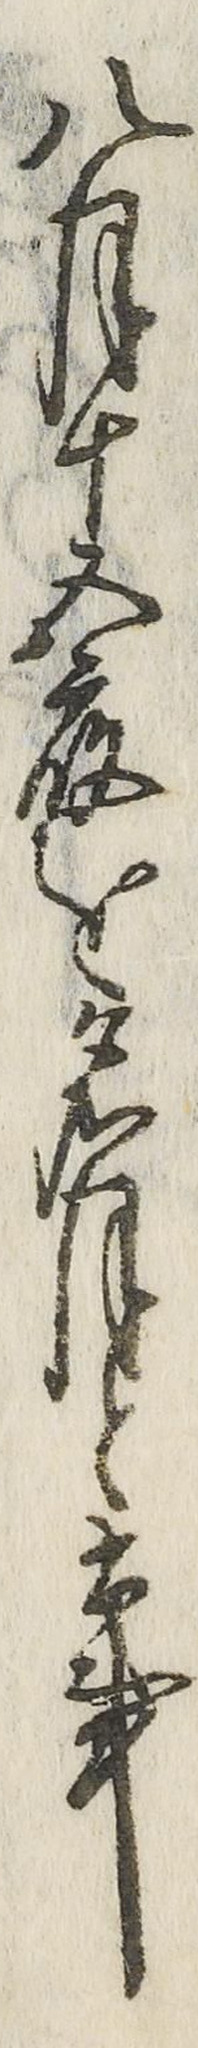八月十五夜を名月と云事
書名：天地或問珍　天
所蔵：東京大学地震研究所図書室 Earthquake Research Institute Library, The University of Tokyo, JAPAN
